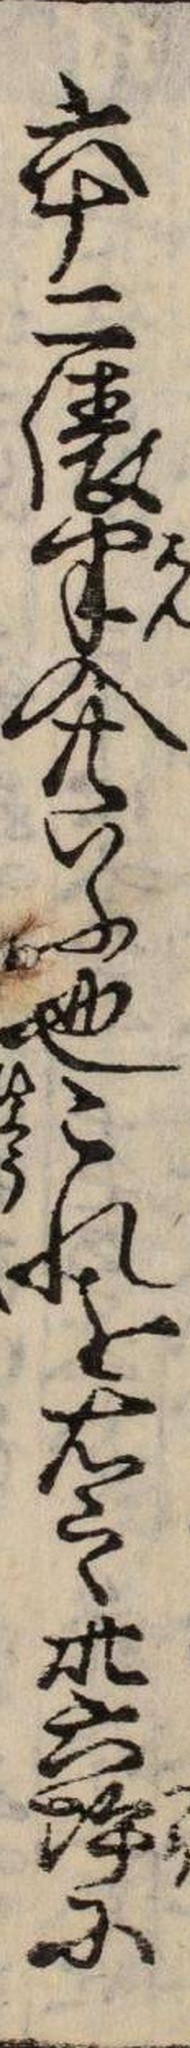六十二俵半入共いふ也これを右の卅六坪に
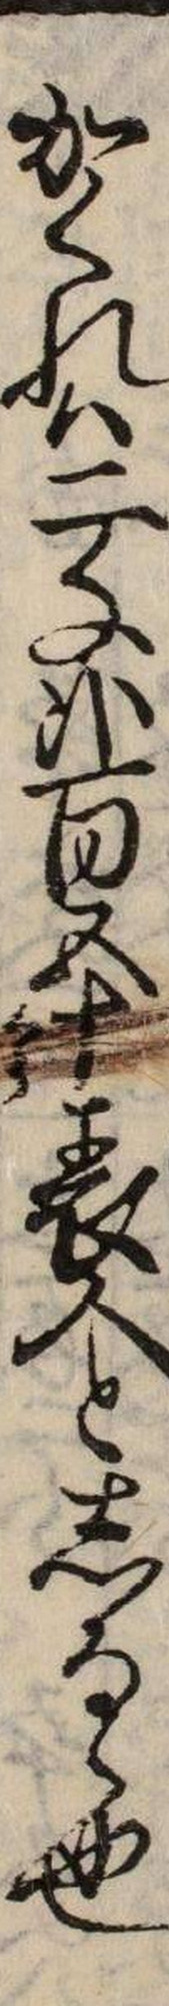かくれは二千弐百五十表入としるゝ也
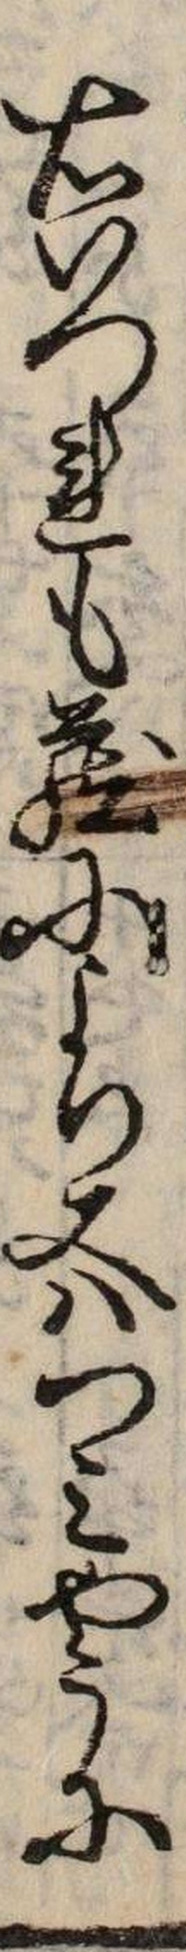右いつれも蔵により又はつみやうに
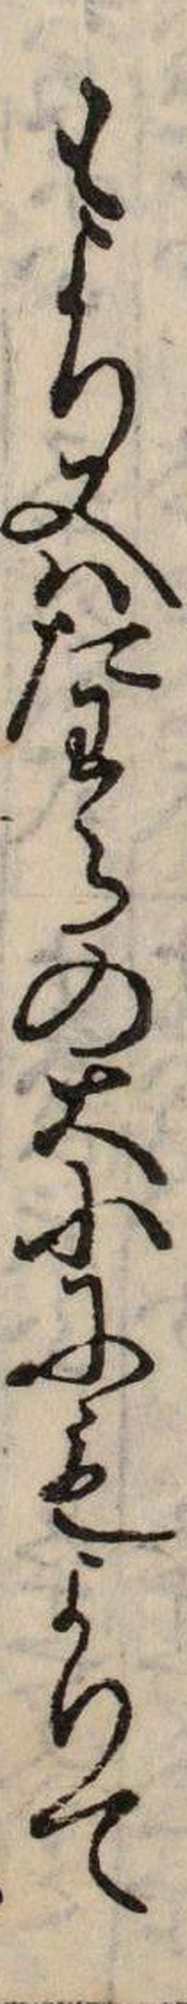もより又はたわらの大小にもよりて
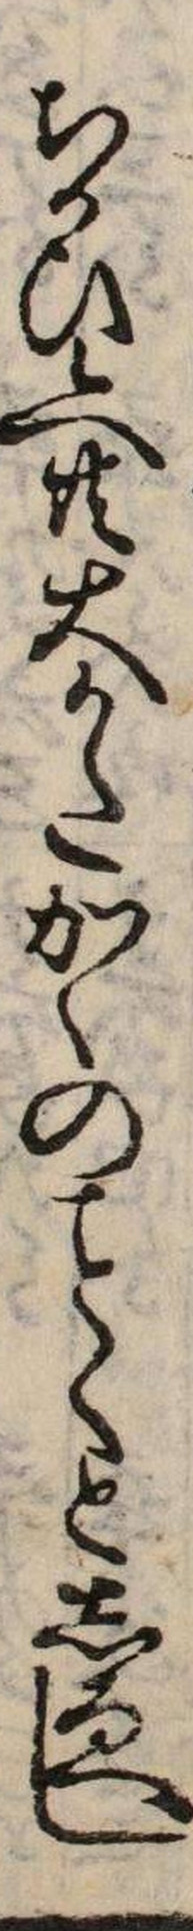ちかひ候へ共大かたかくのことくとしるへし
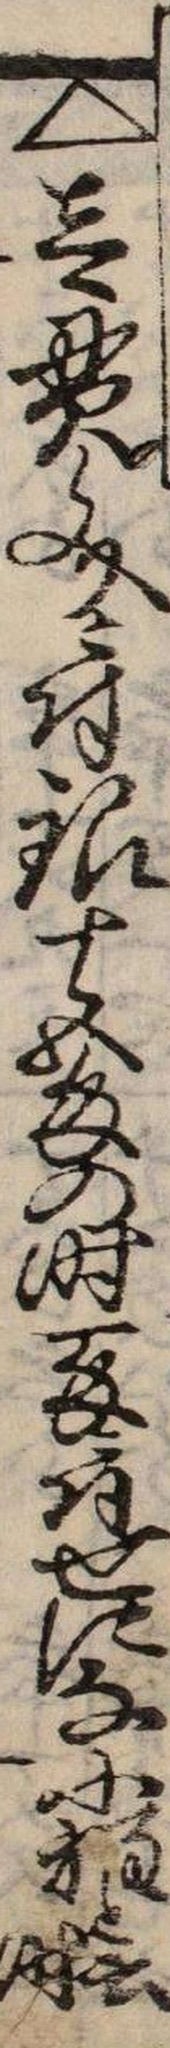△壱貫文に付銀十五匁の時一匁に付せになに程と云時
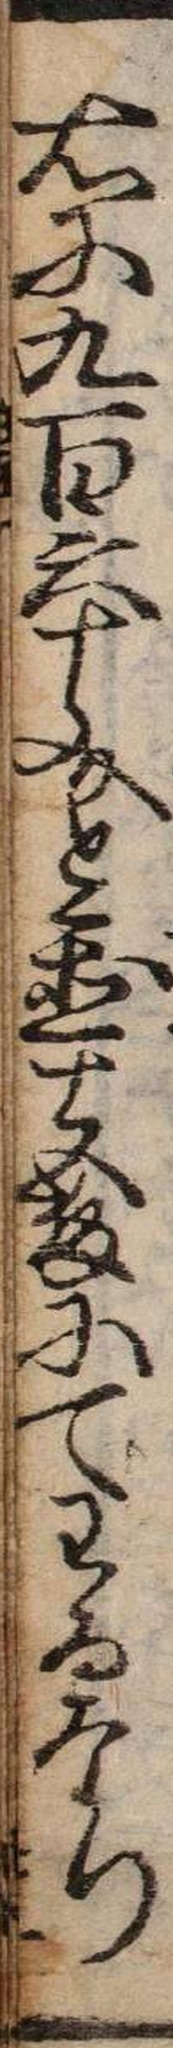右に九百六十文と置十五匁にてわるなり

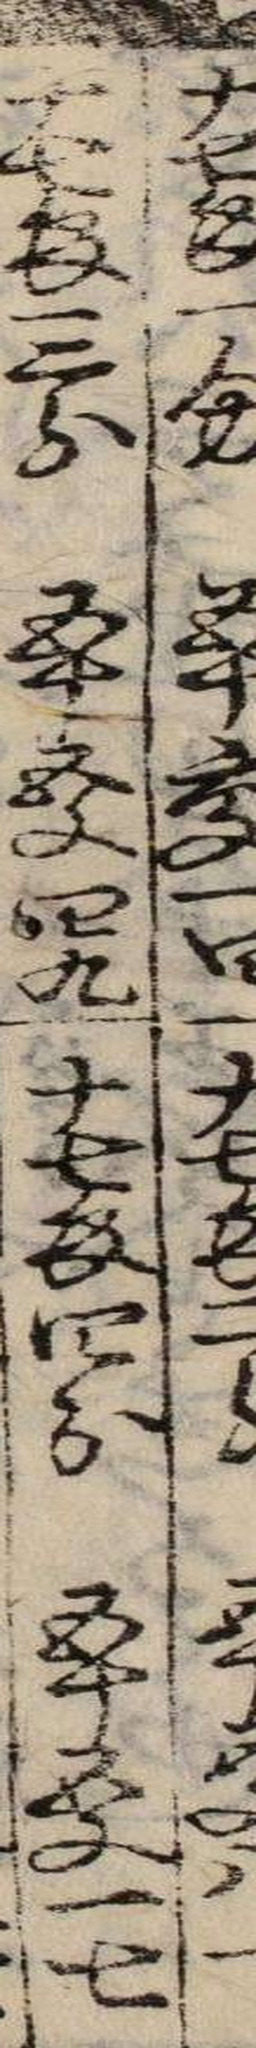十七匁三分五十五文四九十七匁四分五十五文一七
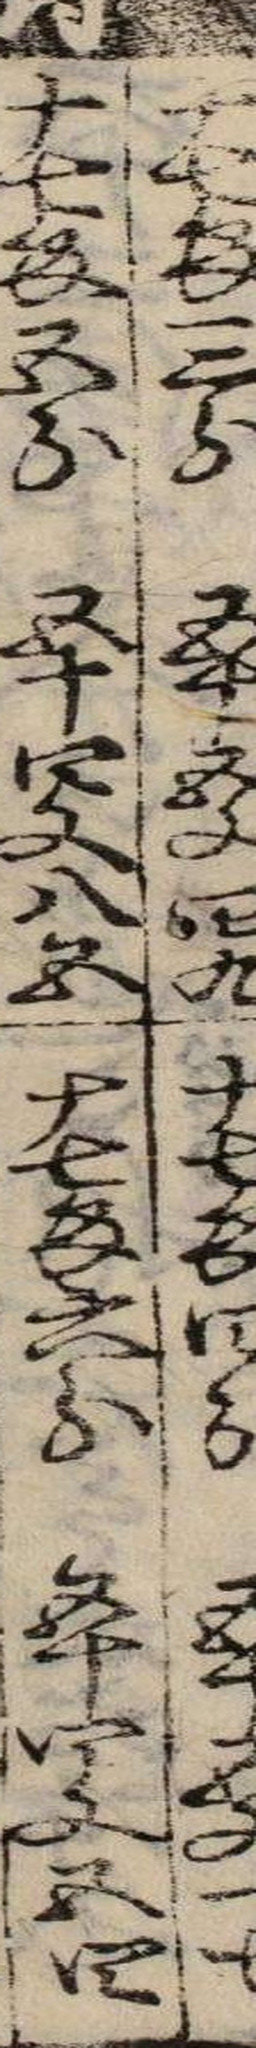十七匁五分五十四文八五十七匁六分五十四文五四
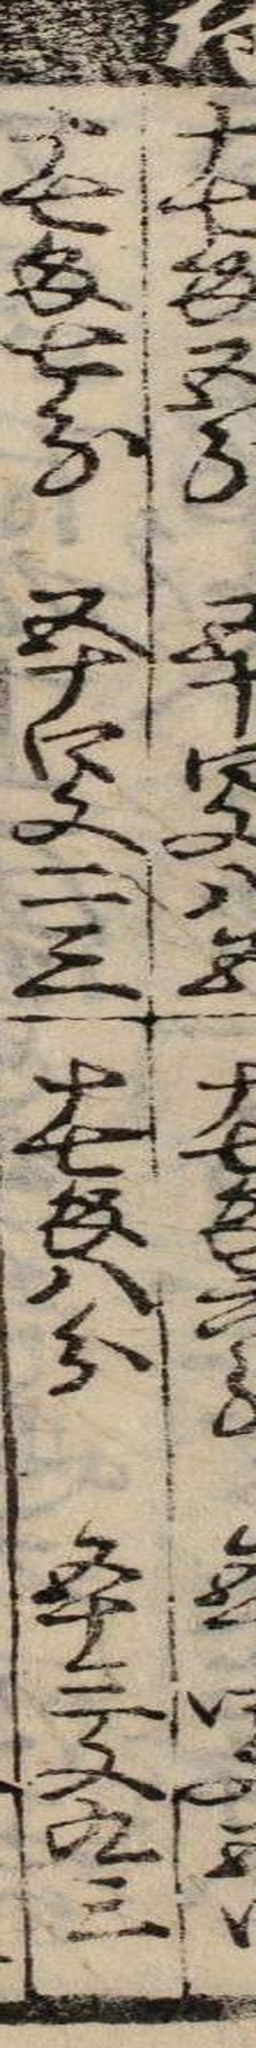十七匁七分五十四文二三十七匁八分五十三文九三
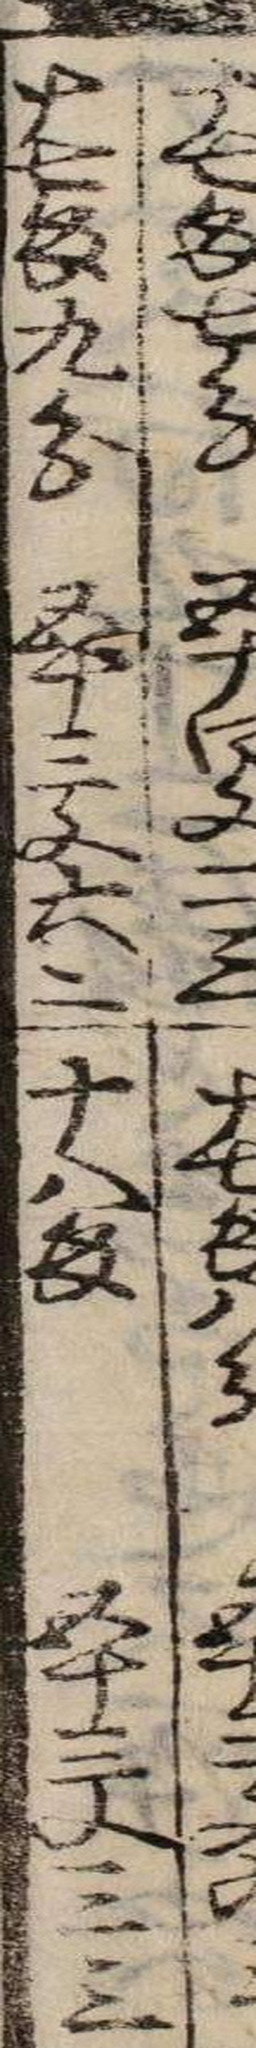十七匁九分五十三文六二十八匁五十三文三三
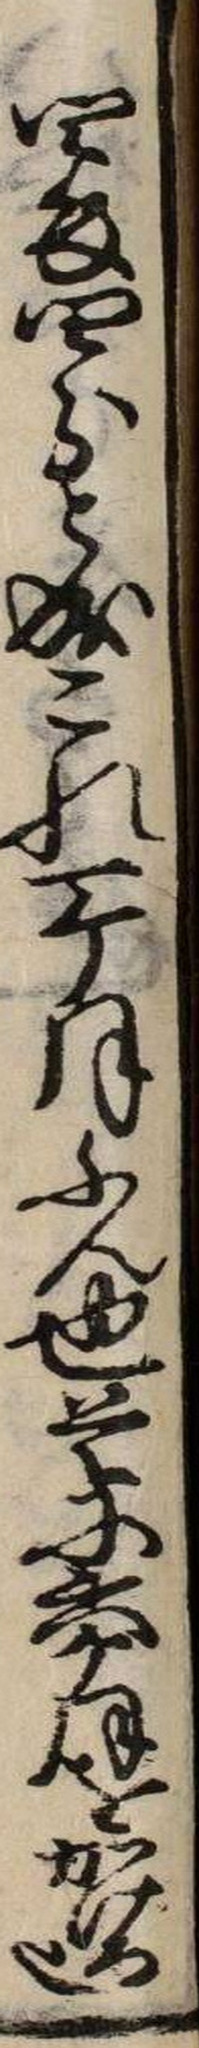四反四分と成これ一ヶ月ふん也是に六ヶ月をかける
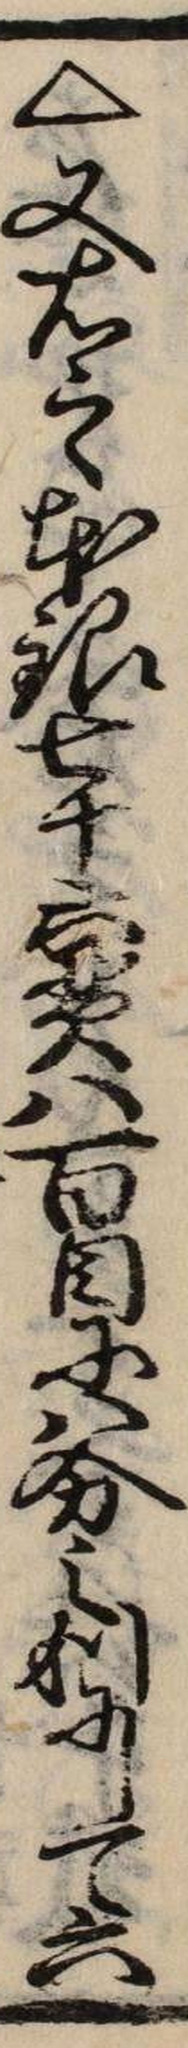△又右之本銀七十六貫八百目に八分之利にして六
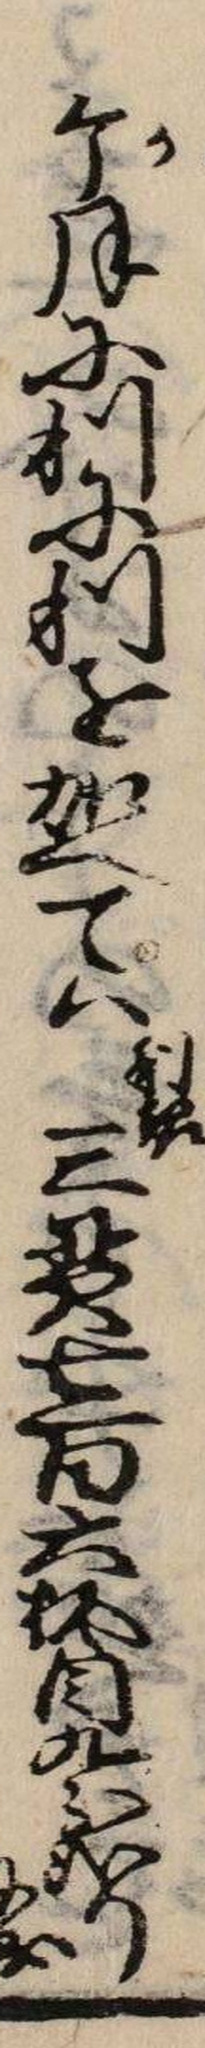ヶ月に利に利を加へては廿三貫七百六拾目九分かり
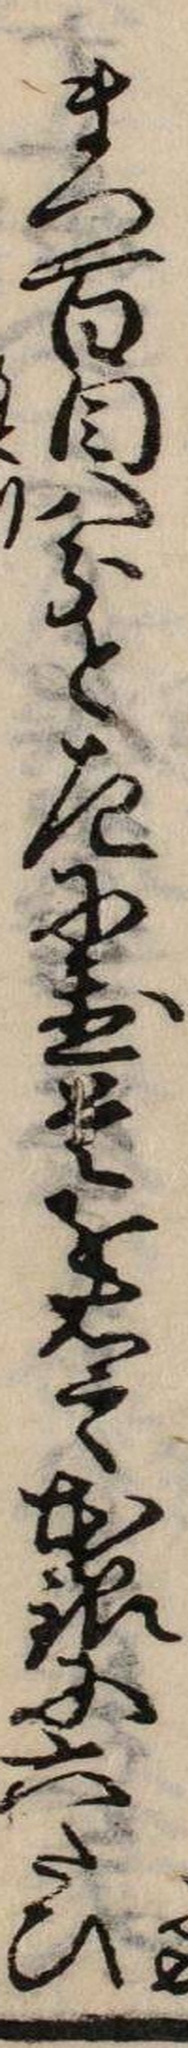まつ百目八分と左に置是を右之本銀に六たひ
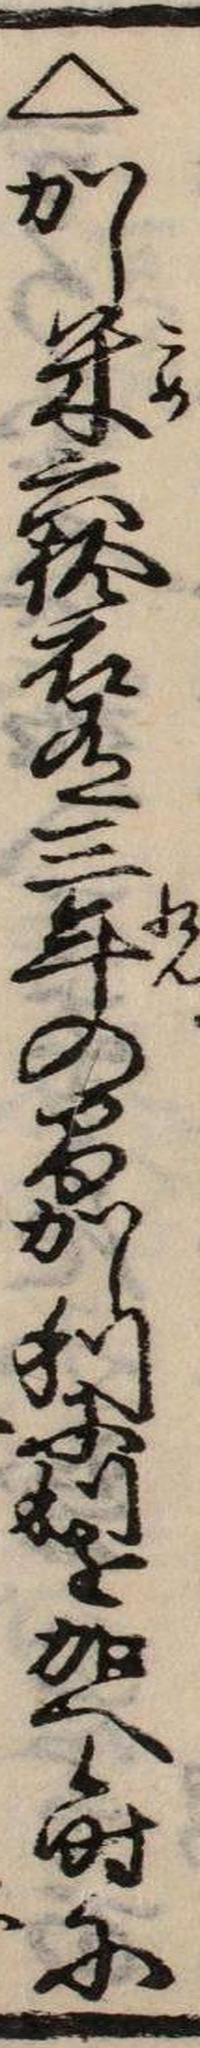△かし米六拾石有三年の間かし利に利を加へ候時に
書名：塵劫記（寛永11年自跋、京都府立京都学・歴彩館追貴8）
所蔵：京都府立京都学・歴彩館 国文学研究資料館
